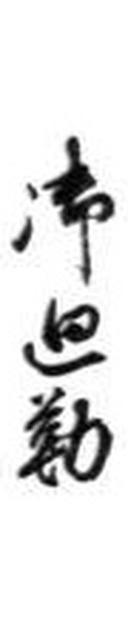御廻勤
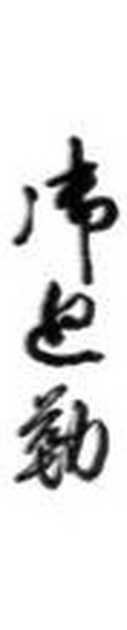御廻勤
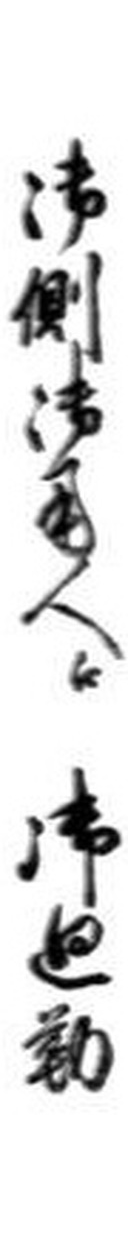御側御用人江御廻勤
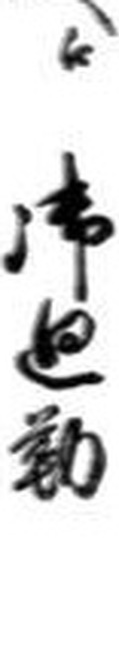御廻勤
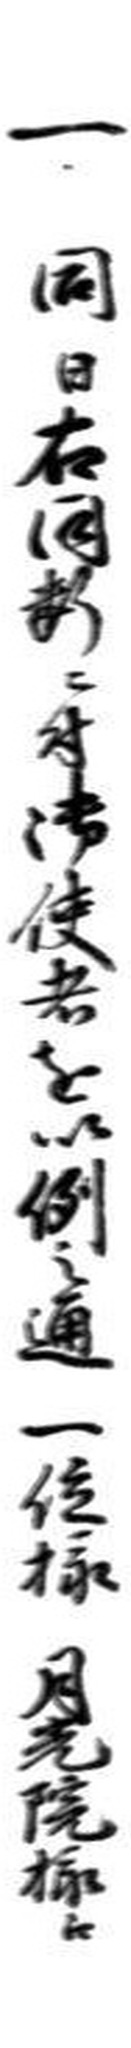一同日右同断ニ付御使者を以例之通一位様月光院様江
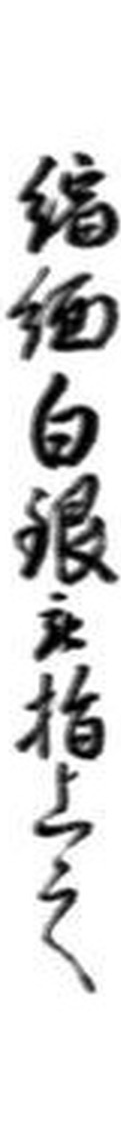縮緬白銀被指上之
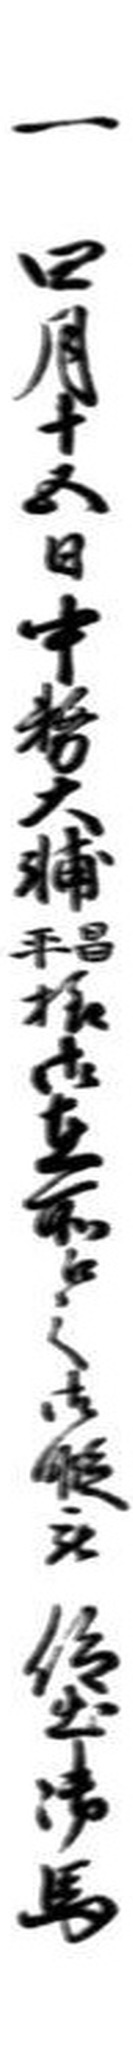一四月十五日中務大輔昌平様御在所江之御暇被仰出御馬
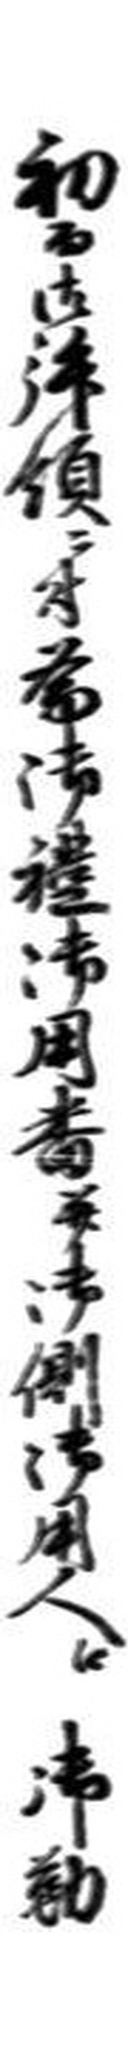初而御拝領ニ付為御礼御用番幷御側御用人江御勤
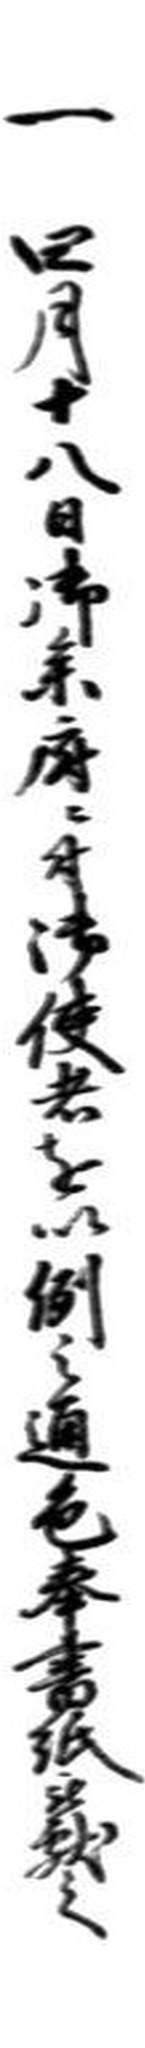一四月十八日御参府ニ付御使者を以例之通色奉書紙被献之
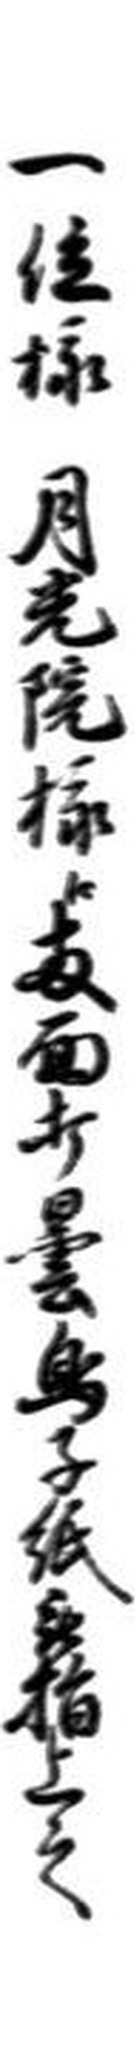一位様月光院様江両面打曇鳥子紙被指上之
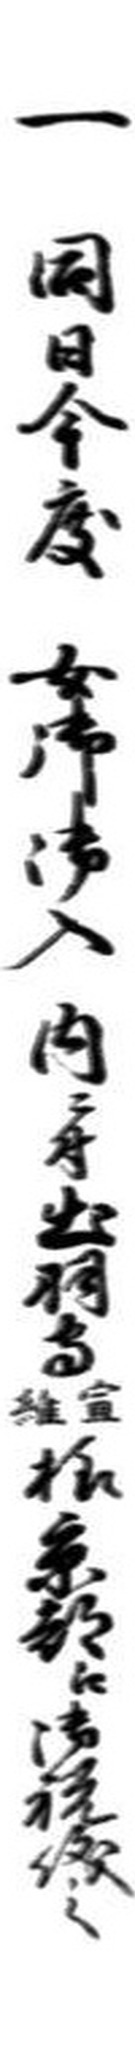一同日今度女御御入内ニ付出羽守宣維様京都江御祝儀之
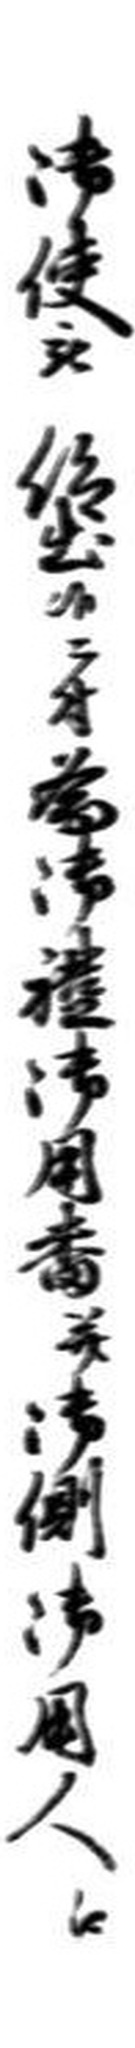御使被仰出候ニ付為御礼御用番幷御側御用人江
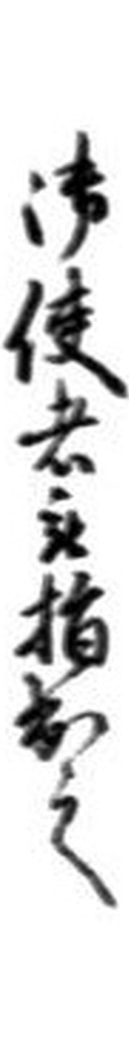御使者被指出之

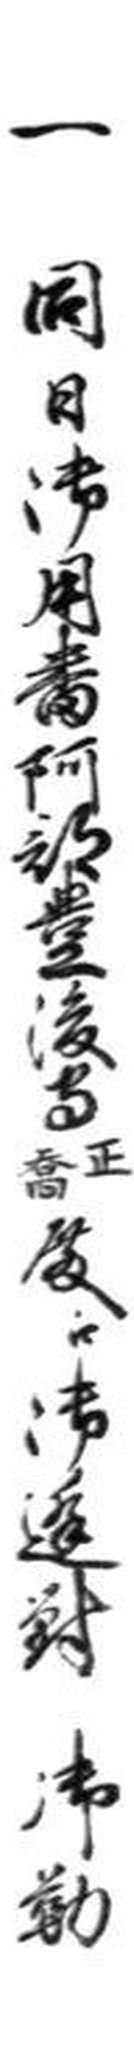一同日御用番阿部豊後守正喬殿江御逢対御勤
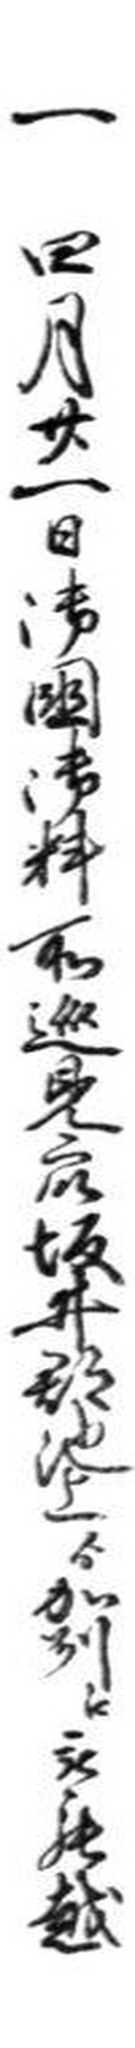一四月廿一日御国御料所巡見衆坂井郡池上ゟ加州江被罷越
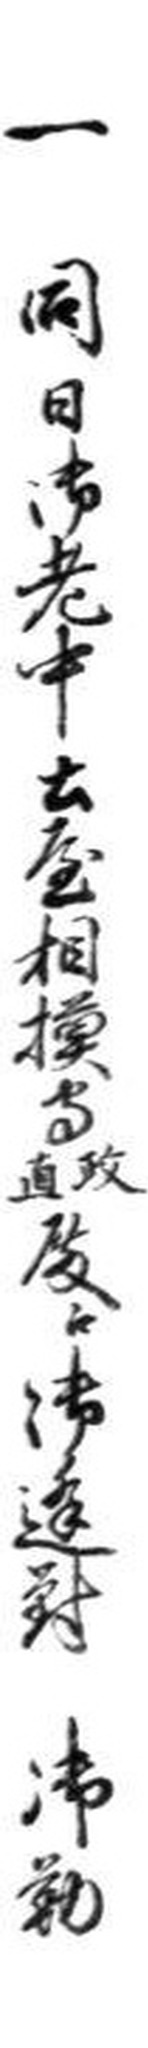一同日御老中土屋相模守政直殿江御逢対
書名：家譜 三十一 吉邦公 享保元年
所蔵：福井県文書館 Fukui Prefectural Archives
